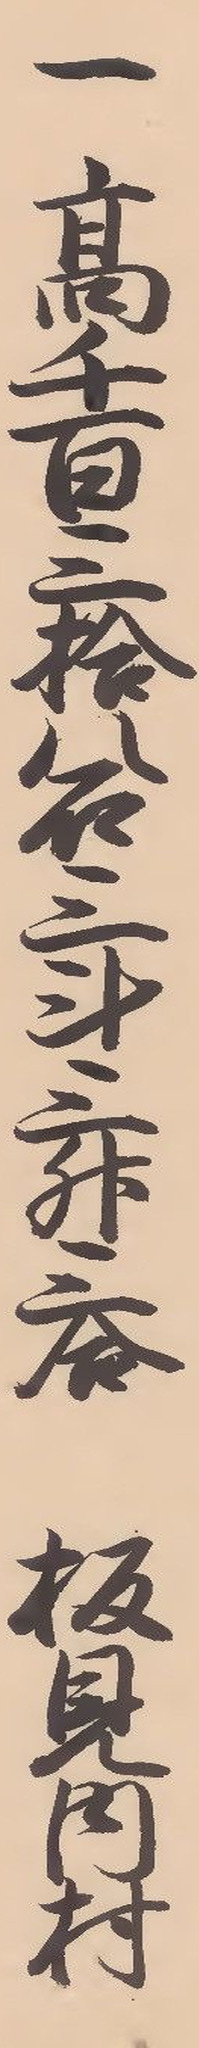一高千百三拾八石三斗三升三合板見内村
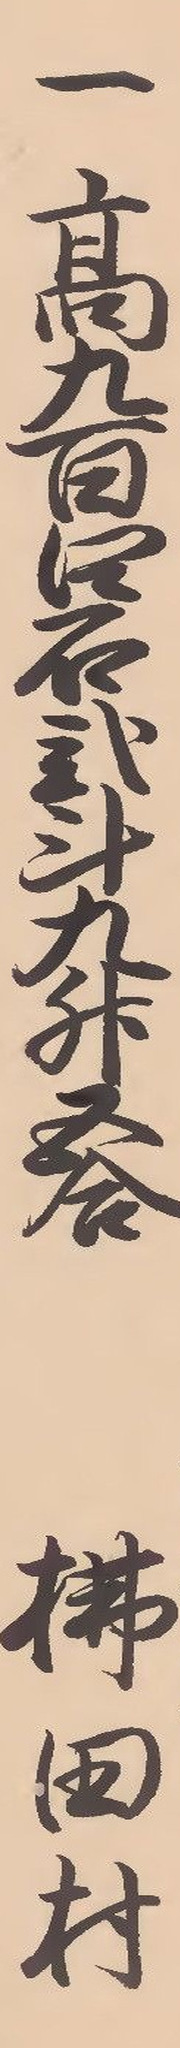一高九百四石弐斗九升五合払田村
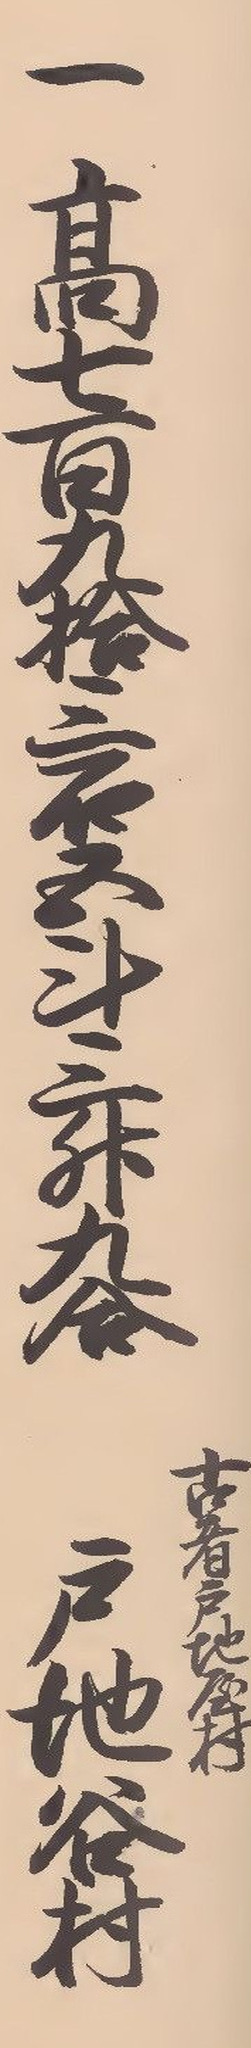一高七百九拾三石五斗三升九合戸地谷村
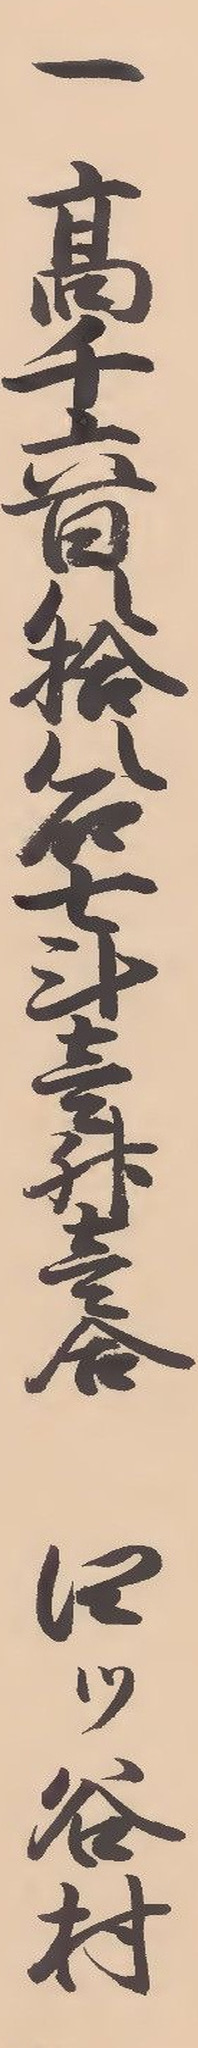一高千六百八拾八石七斗壱升壱合四ッ谷村
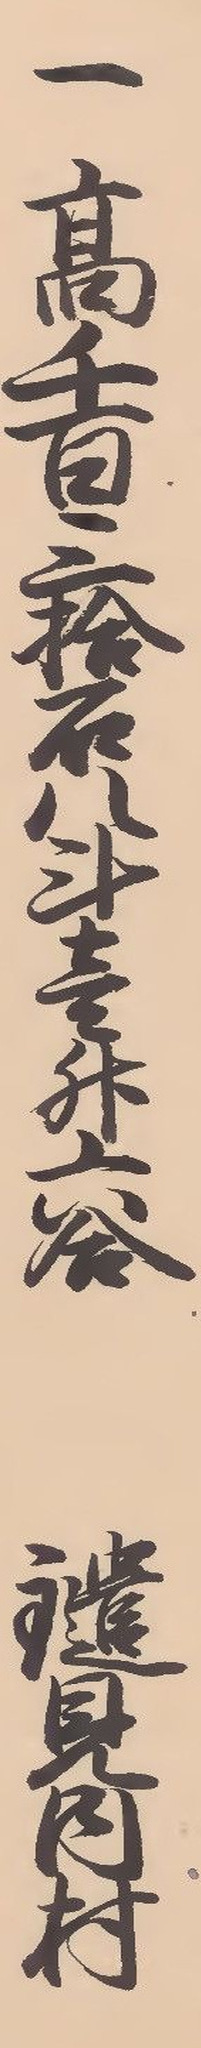一高千百三拾石八斗壱升六合鑓見内村
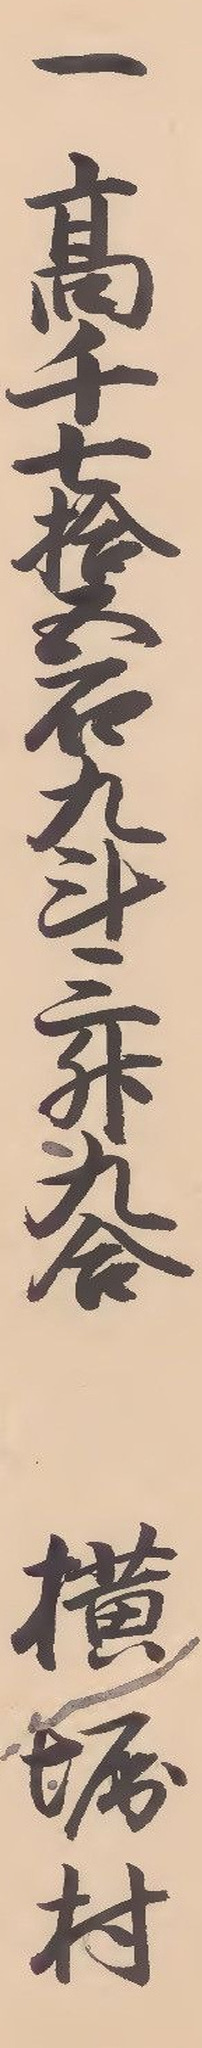一高千七拾五石九斗三升九合横堀村

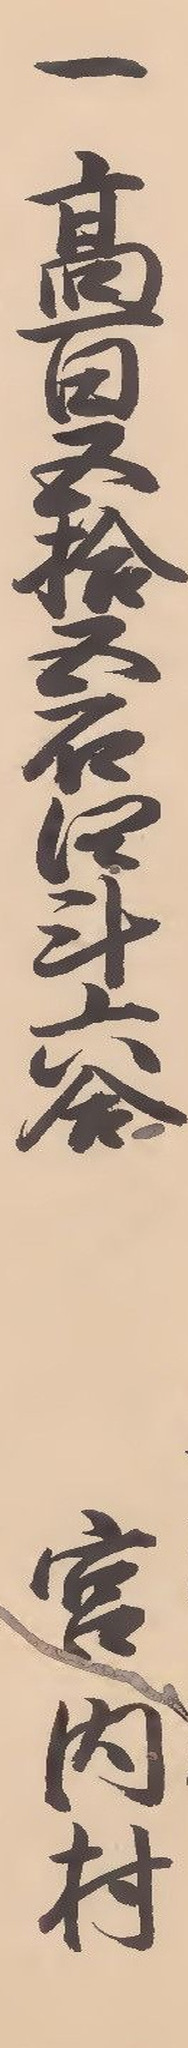一高百五拾五石四斗六合宮内村
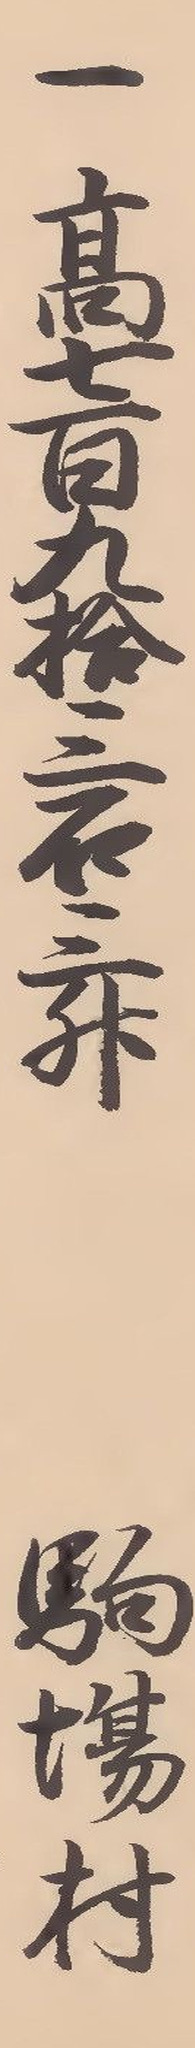一高七百九拾三石三升駒場村
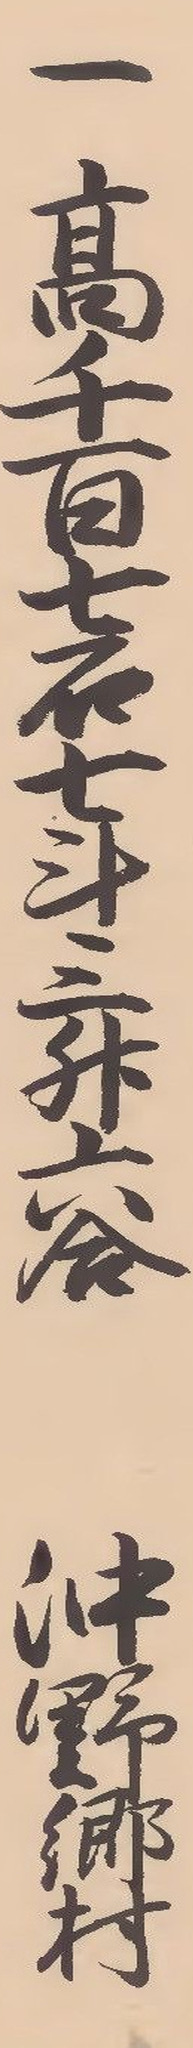一高千百七石七斗三升六合沖野郷村
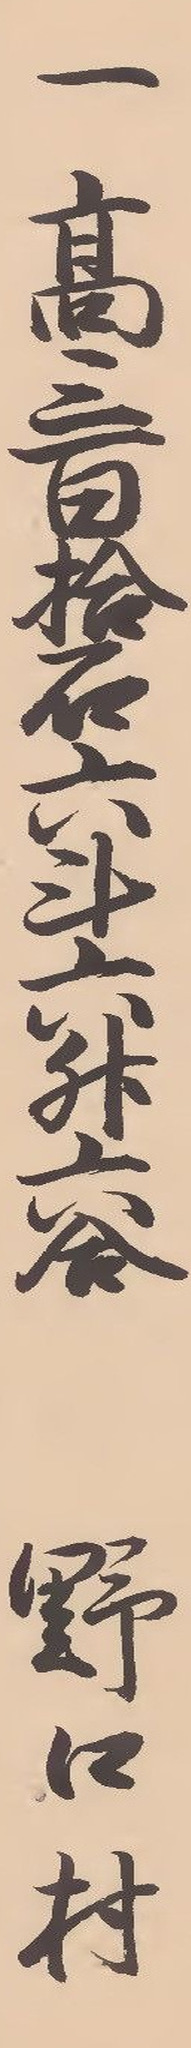一高三百拾石六斗六升六合野口村
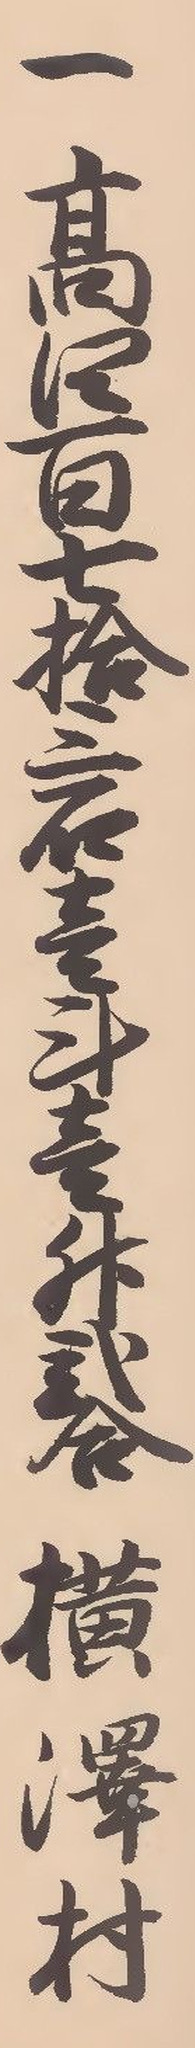一高四百七拾三石壱斗壱升弐合横沢村
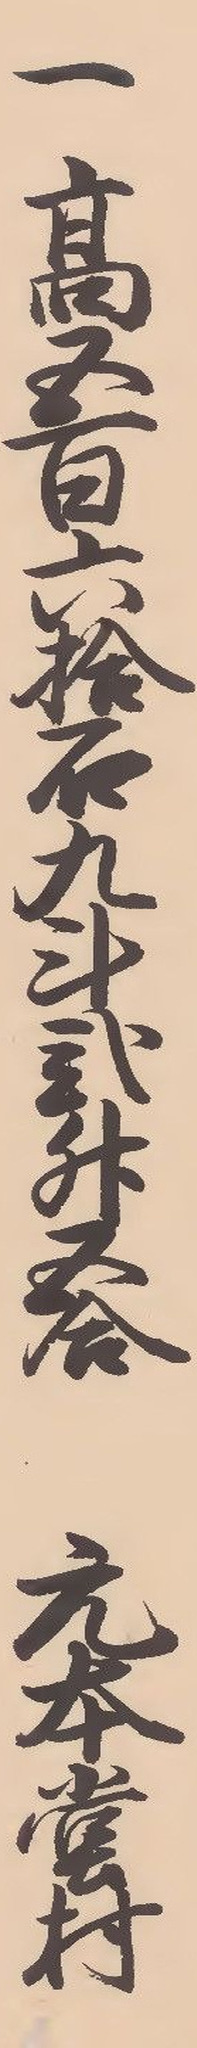一高五百六拾石九斗弐升五合元本堂村
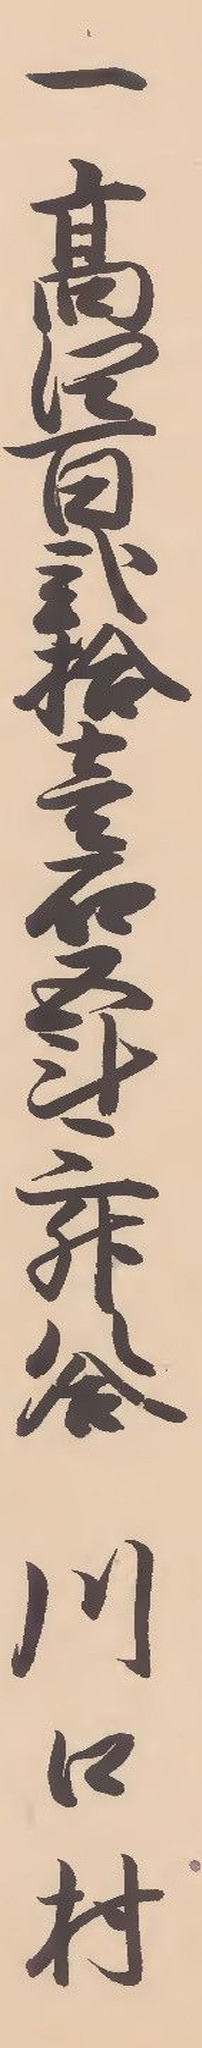一高四百弐拾壱石五斗三升八合川口村
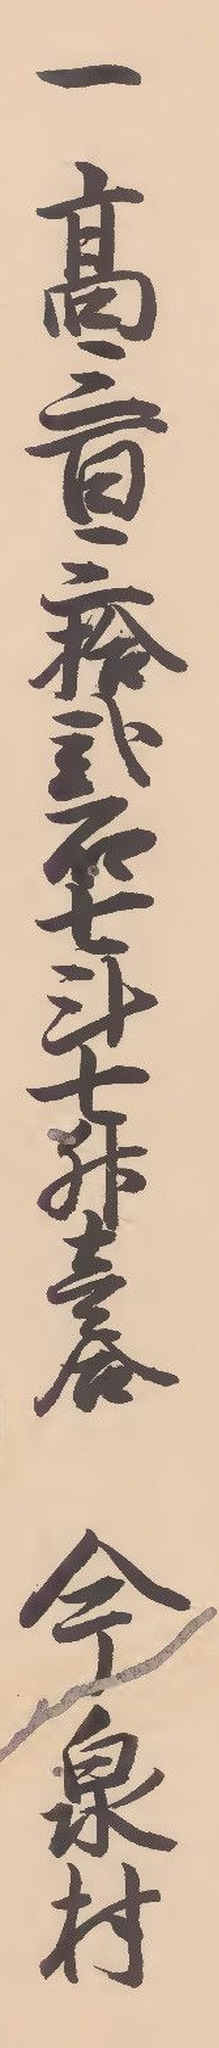一高三百三拾弐石七斗七升壱合今泉村

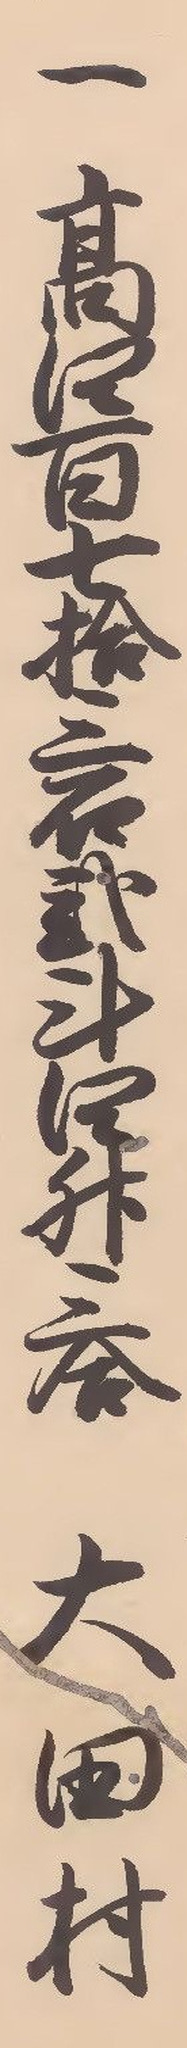一高四百七拾三石弐斗四升三合大田村
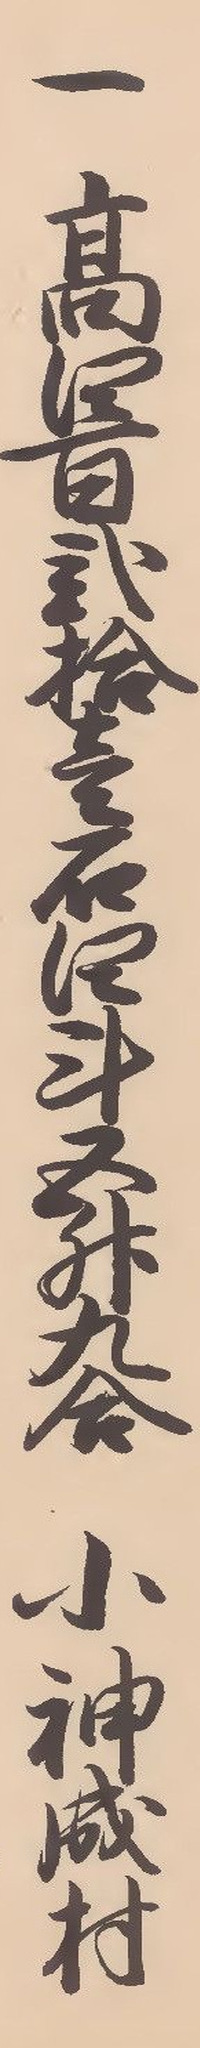一高四百弐拾壱石四斗五升九合小神成村
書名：出羽国郷帳　５
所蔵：国立公文書館 National Archives of Japan
